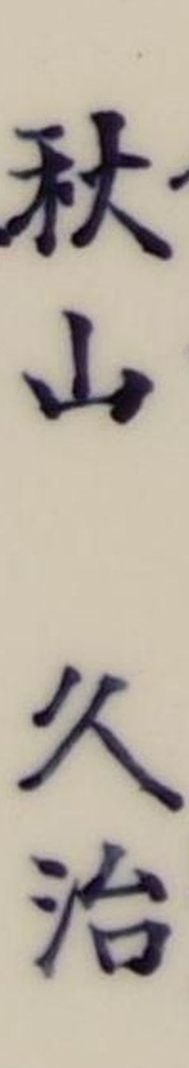秋山久治
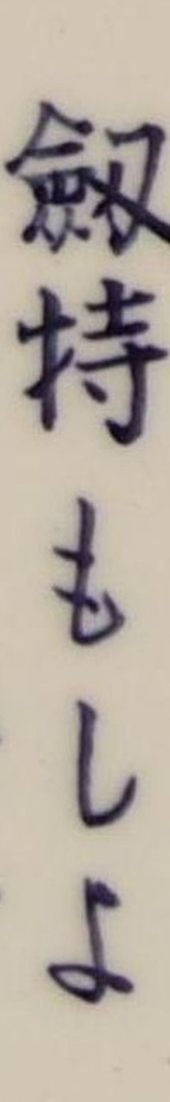剱持もしよ
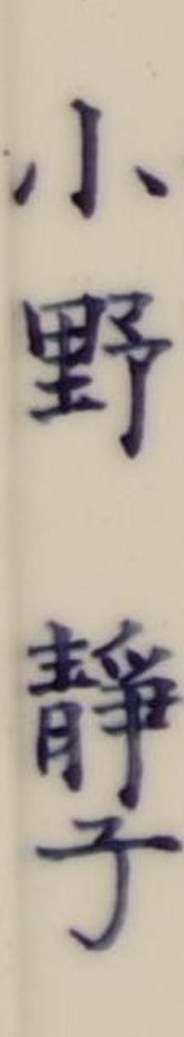小野静子

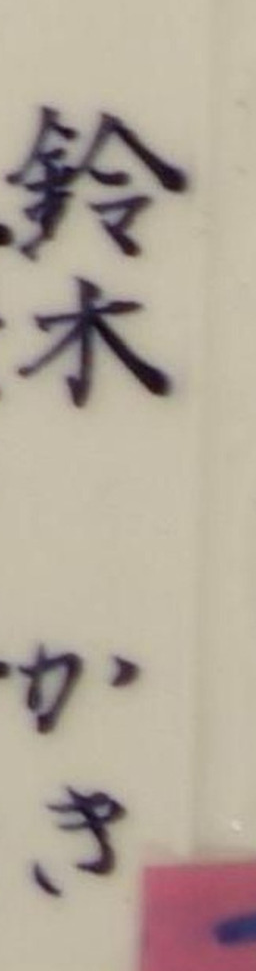鈴木かき
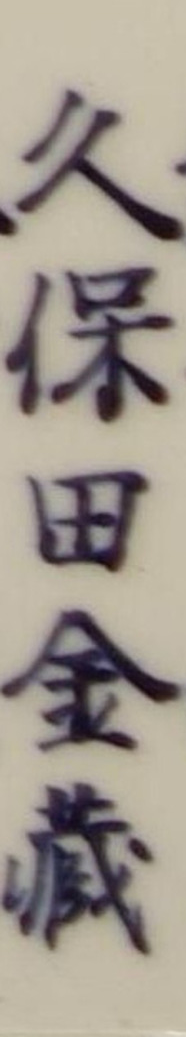久保田金蔵
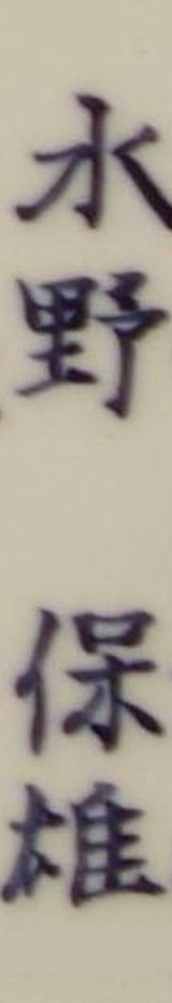水野保雄
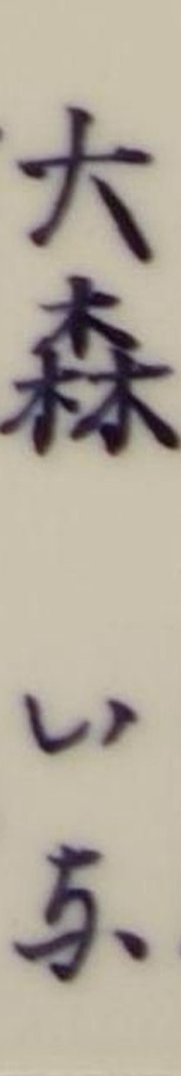大森いな
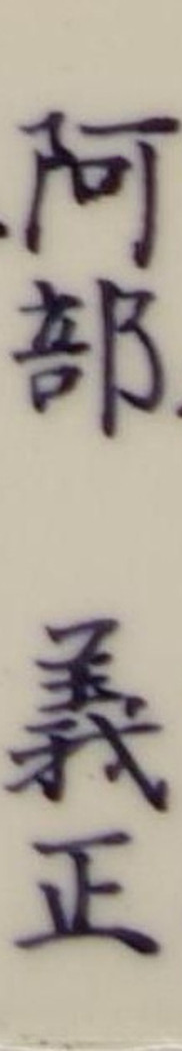阿部義正
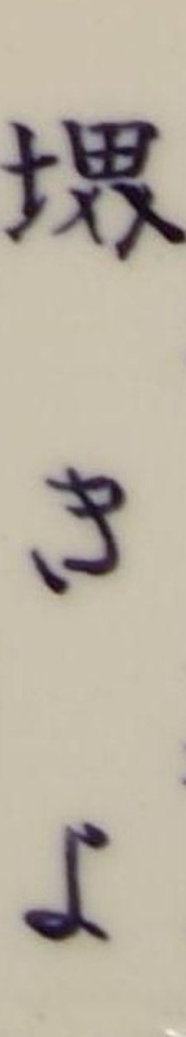堺きよ
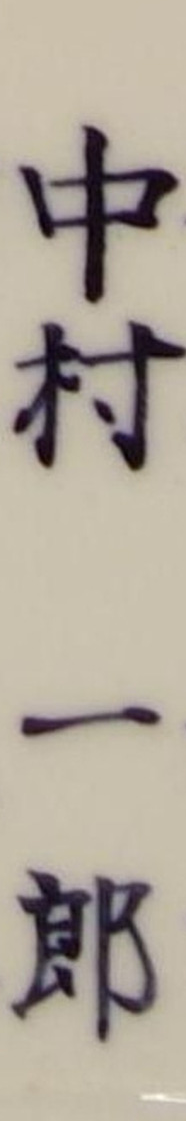中村一郎
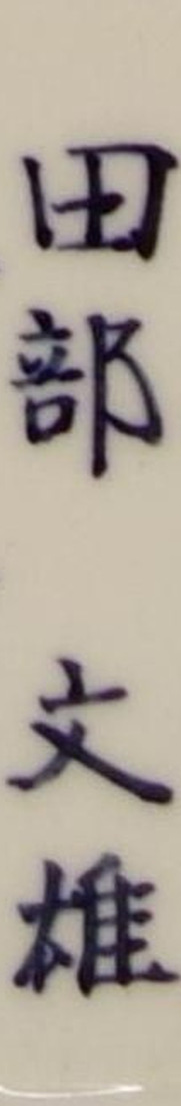田部文雄
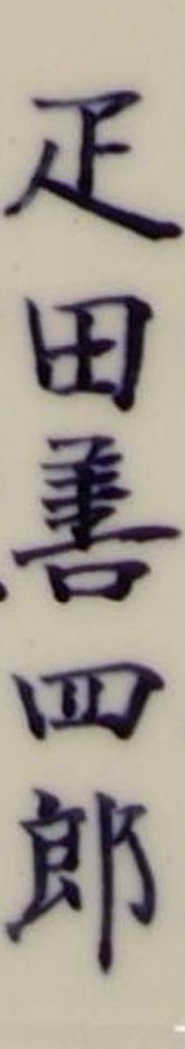疋田善四郎
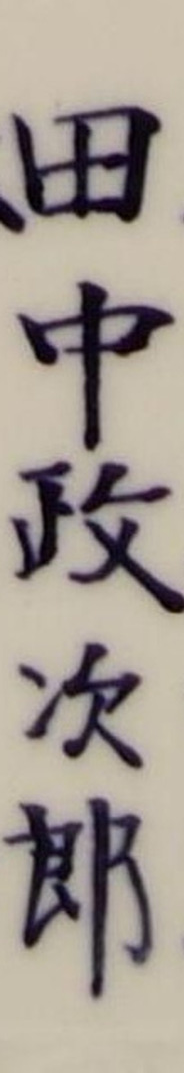田中政次郎
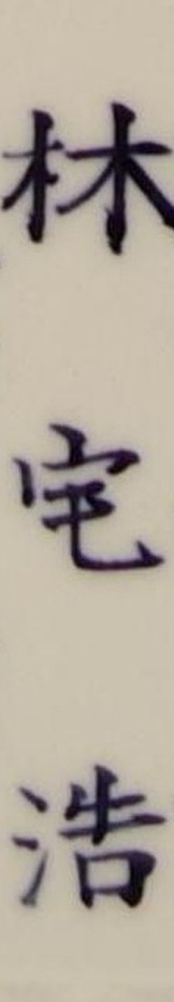林宅浩
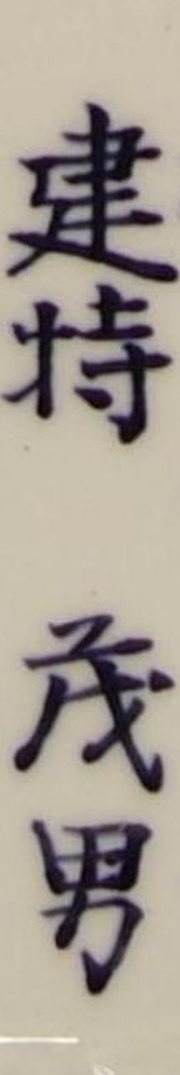建持茂男
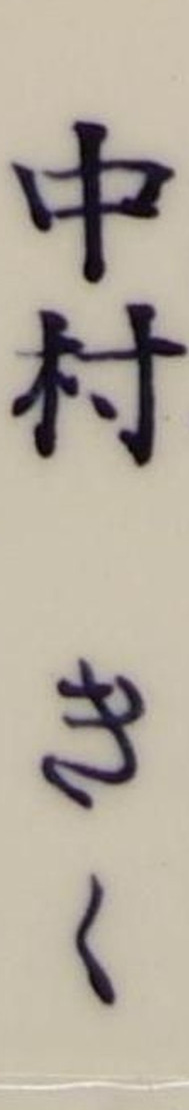中村きく
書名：M~S
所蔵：高野山金剛峯寺
